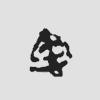思
